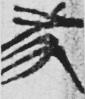寺（時）
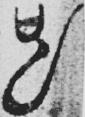也
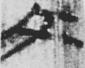文
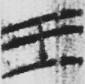王
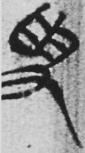受
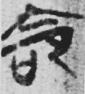命
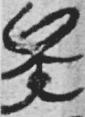矣
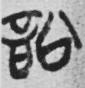訟
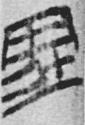坪（平）
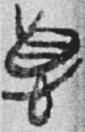惪（德）
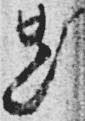也
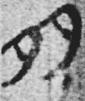多
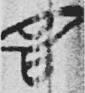言
